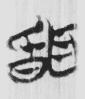䎽
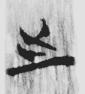之
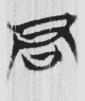君
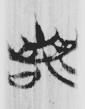若
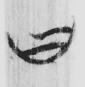曰
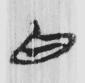白
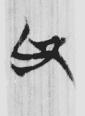父
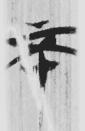不
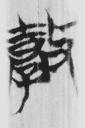{𣪊子}
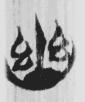幽
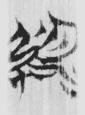溺
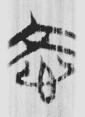忞
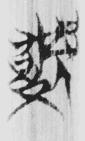{喪死}
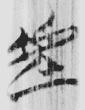𫊟
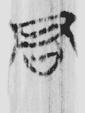君
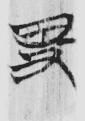卑
